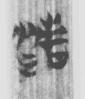清
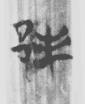邦
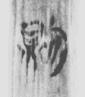則
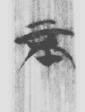不
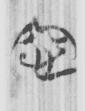{穴心}
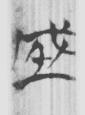城
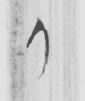人
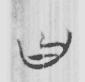曰
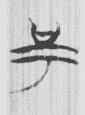吁
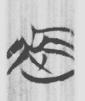麥
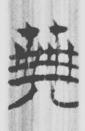典
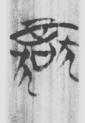獄
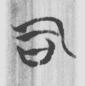司
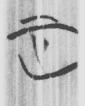正
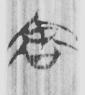{余口}
